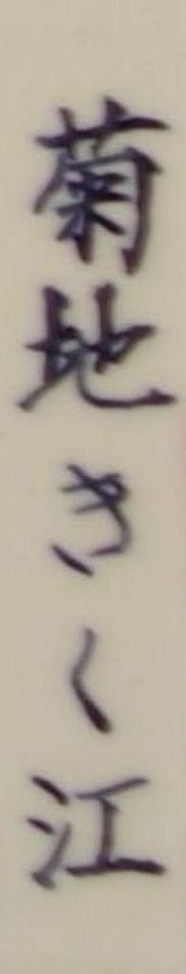菊地きく江
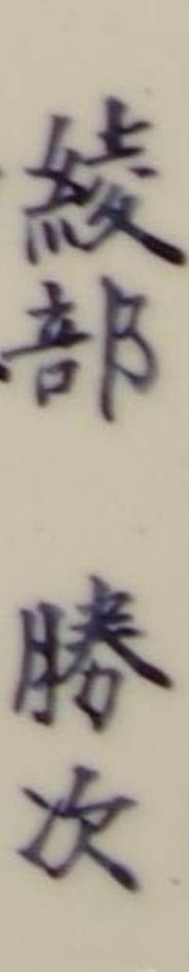綾部勝次
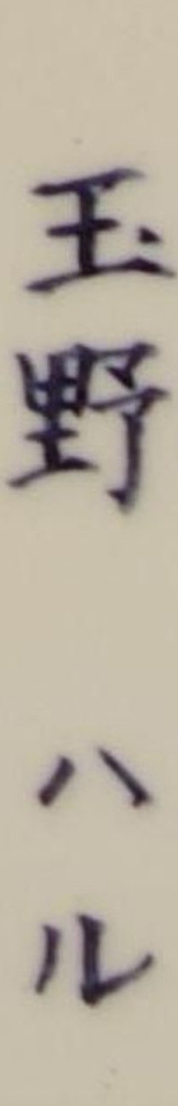玉野ハル
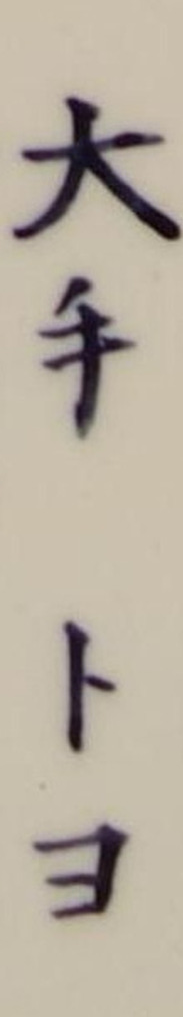大手トヨ
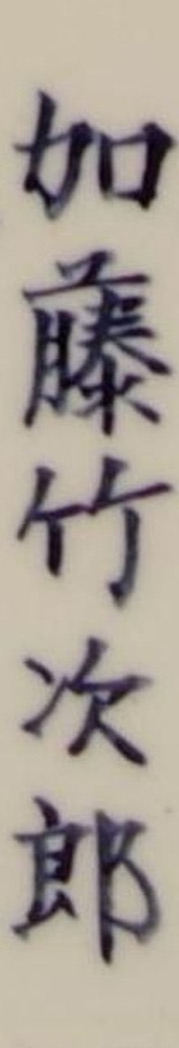加藤竹次郎
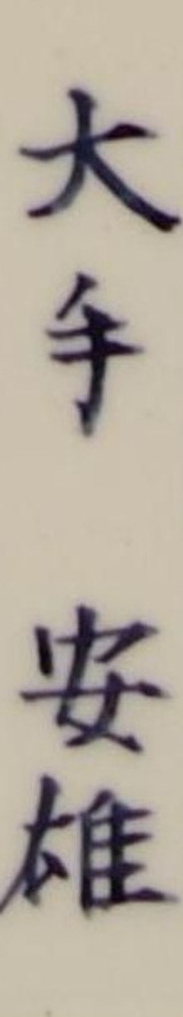大手安雄
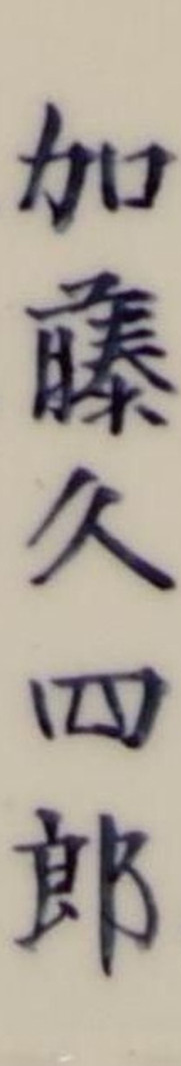加藤久四郎
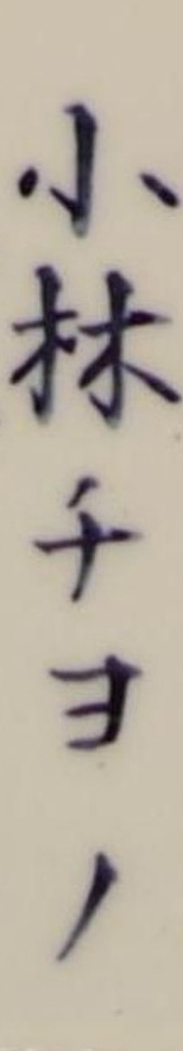小林チヨノ
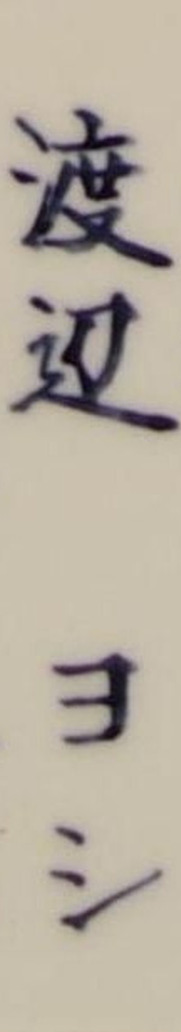渡辺ヨシ
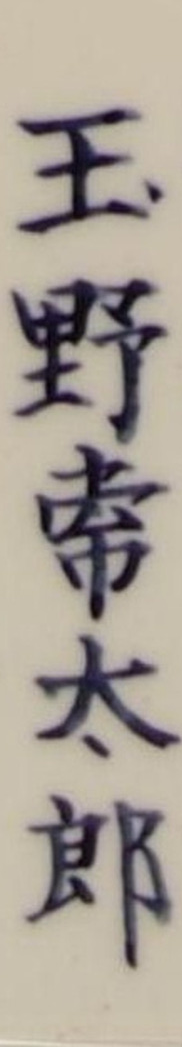玉野常太郎
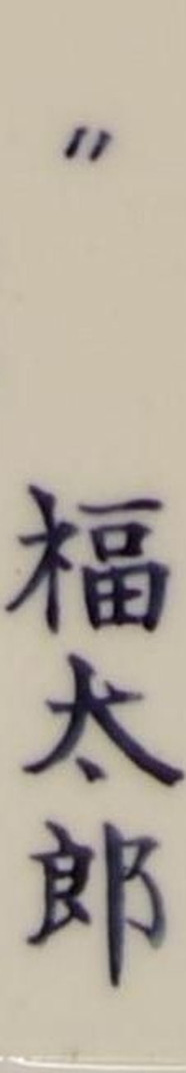福太郎
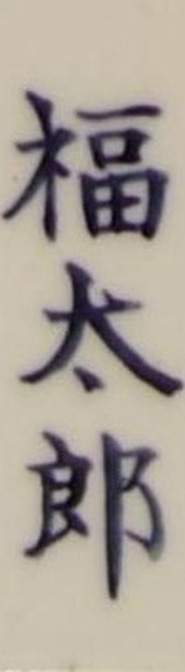福太郎
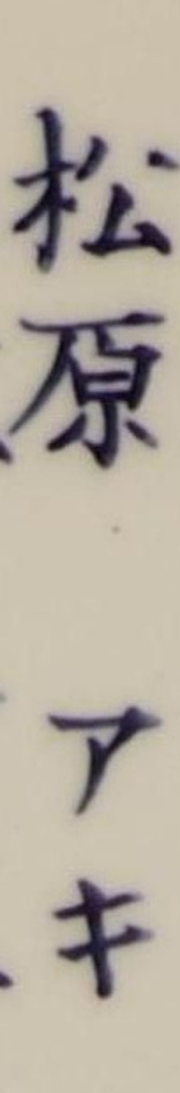松原アキ
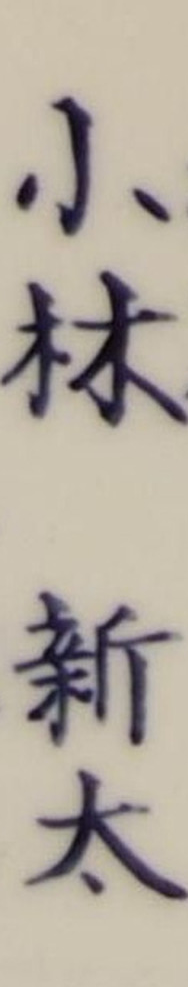小林新太
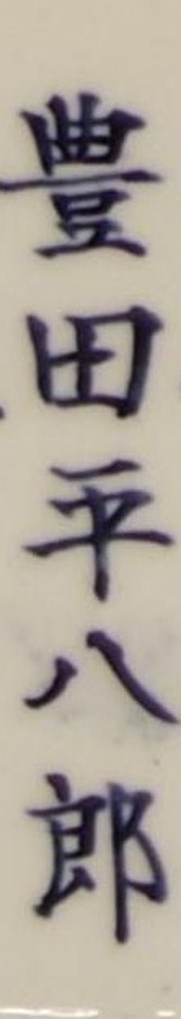豊田平八郎
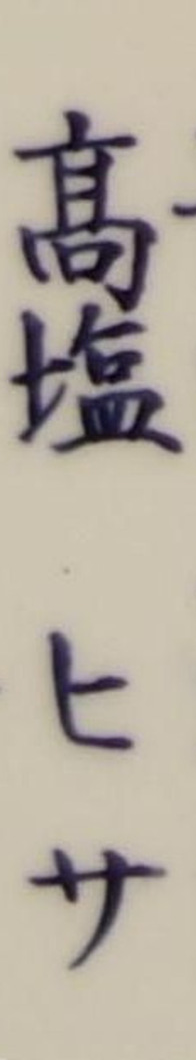高塩ヒサ
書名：E~L
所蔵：高野山金剛峯寺
